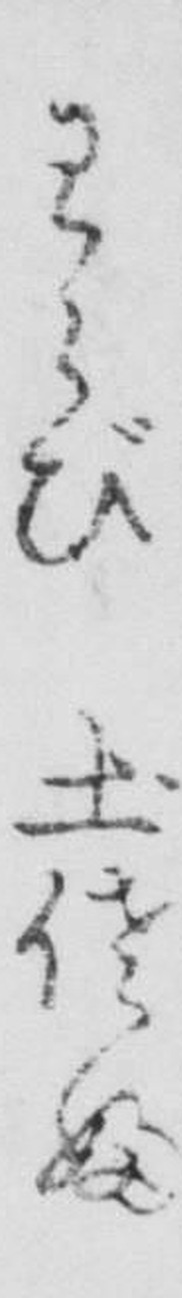わらび土佐ふ
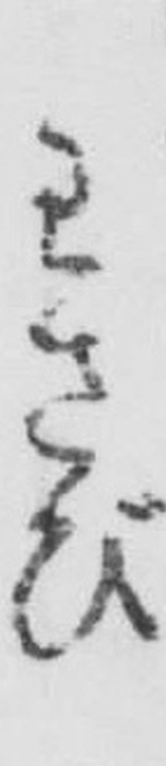わさび
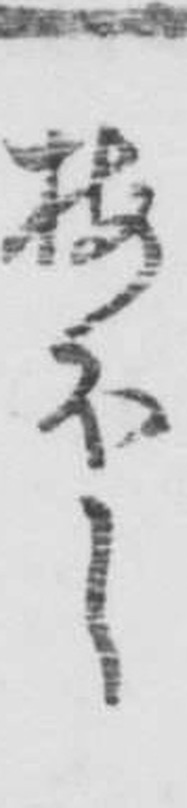梅ほし
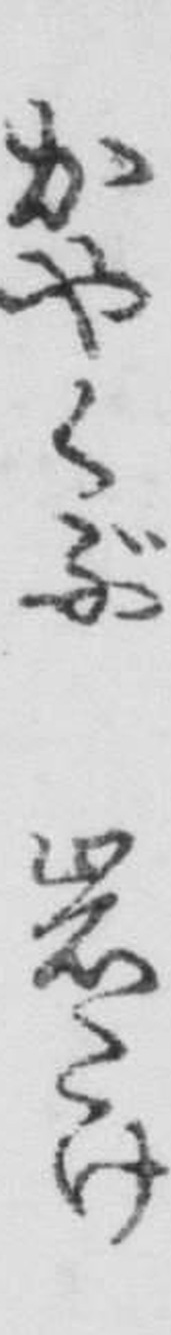かやくぶ岩たけ
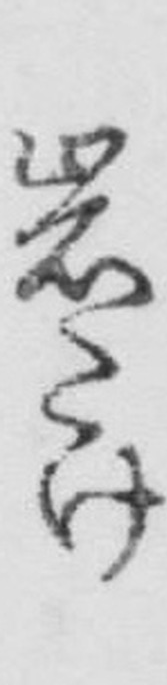岩たけ
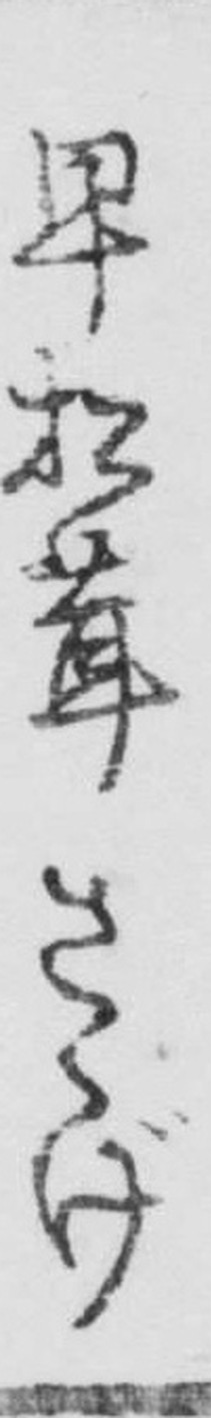早椎茸さゝげ
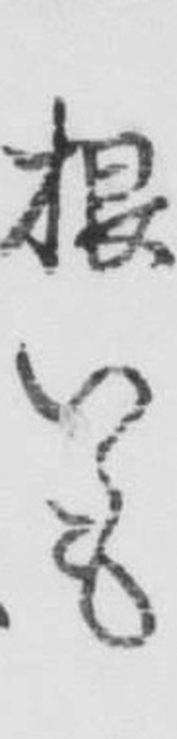根いも
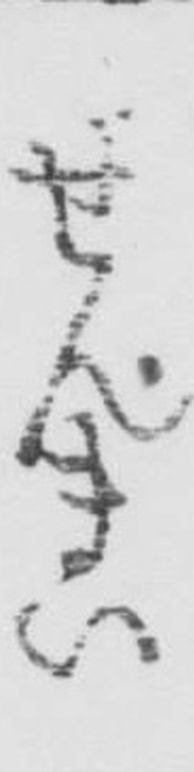ぜんまい
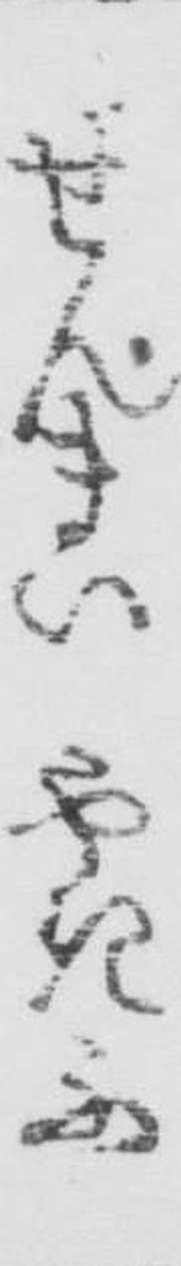ぜんまいやきふ
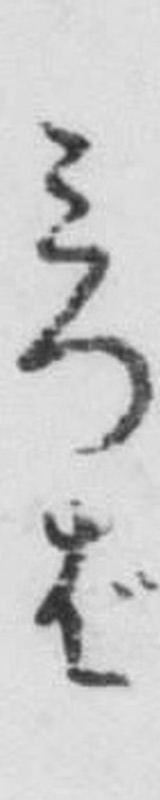みつば
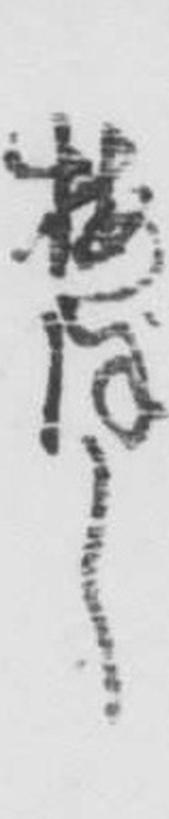梅ぼし
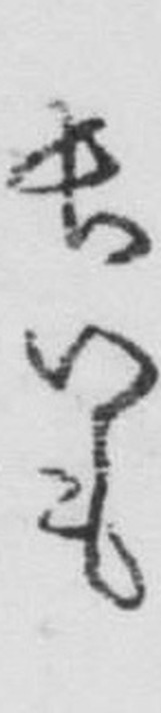根いも
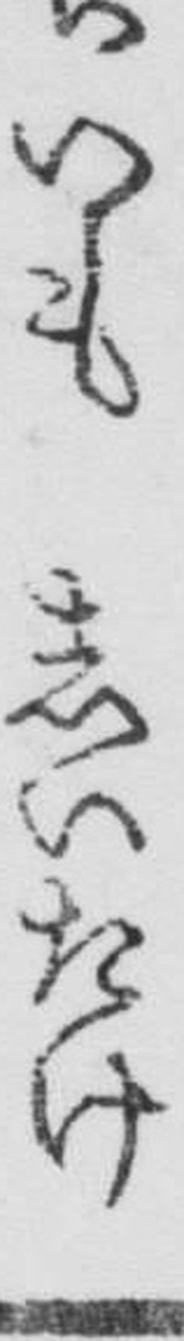長いもしいたけ
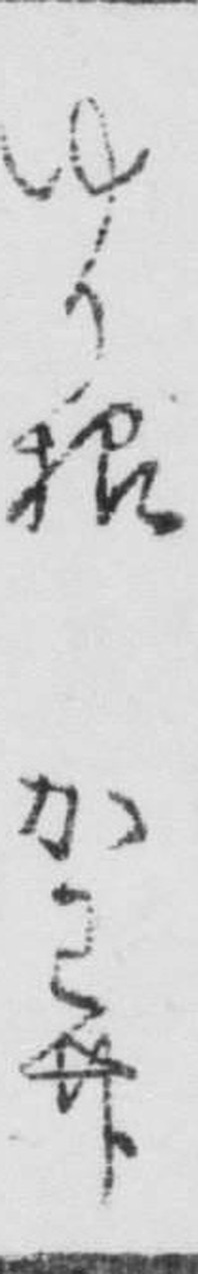ゆり根かわ竹？
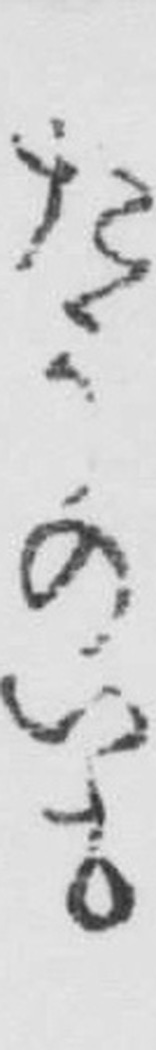たうのいも
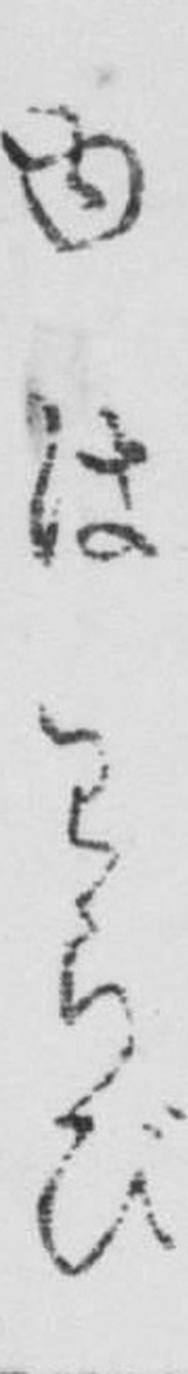ゆはわらび
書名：諸家通用/即席料理
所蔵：大阪府立大学学術情報センター 国文学研究資料館
